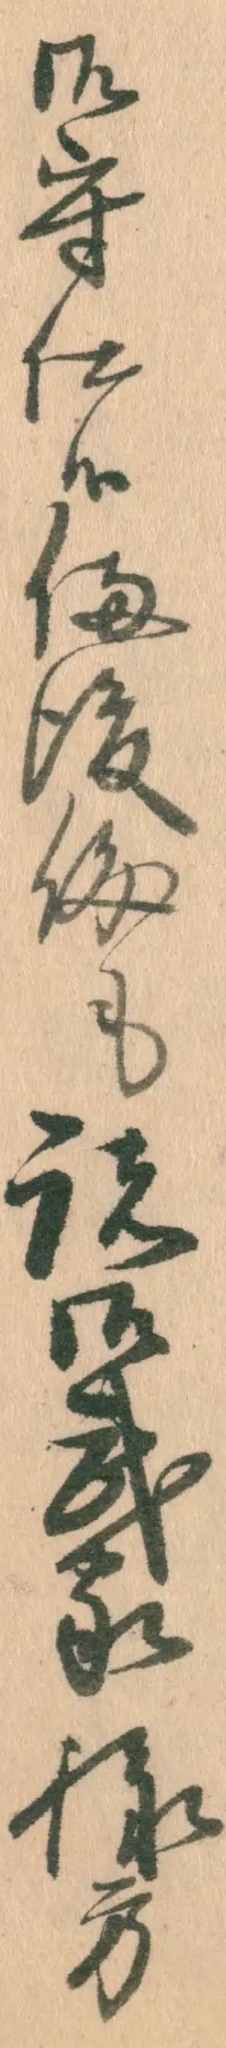御守仕候備後儀も諸御武家様方
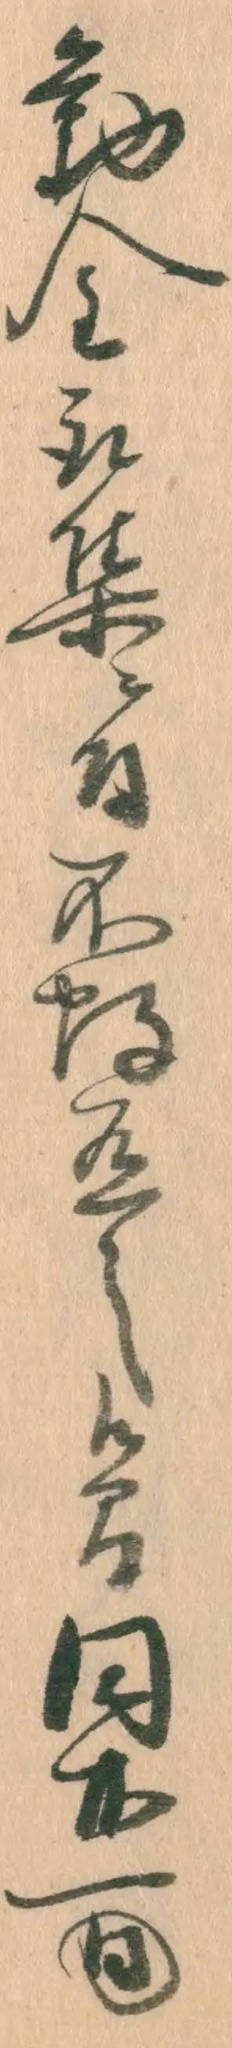勧金取集に付不埒有之候間同廿一
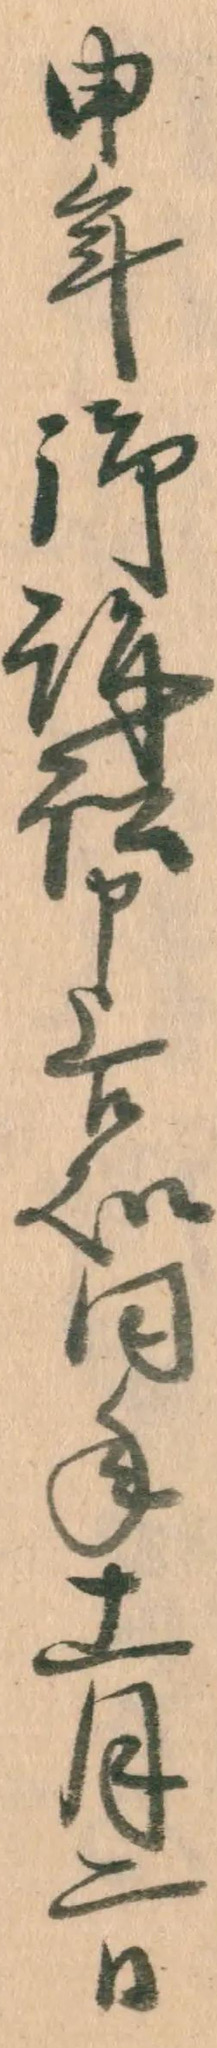申年御訴訟申上候処同年十一月二日
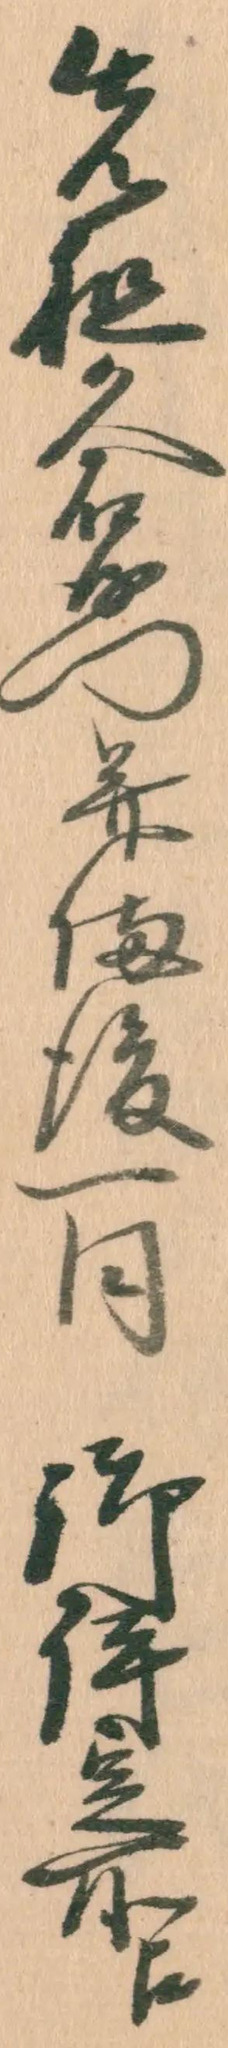先祖久右衛門并備後一同御評定所え
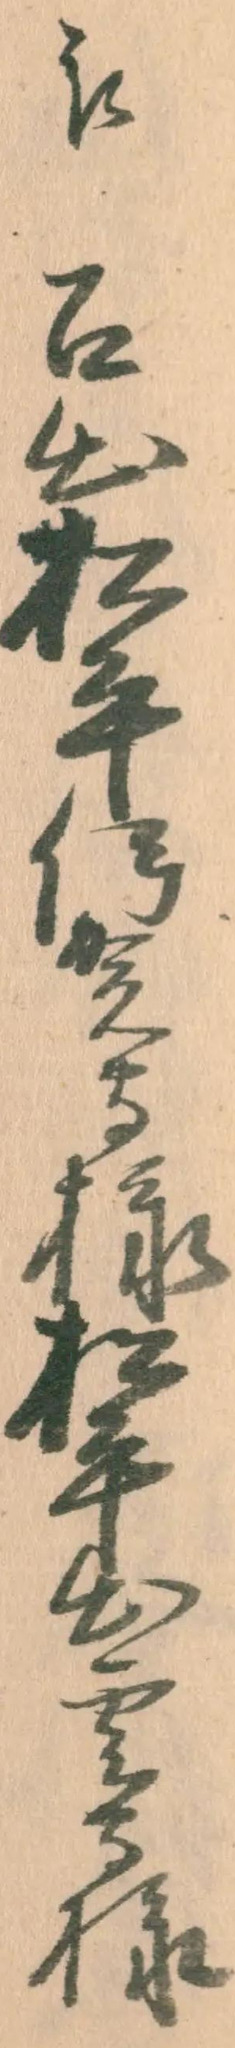被召出松平伊賀守様松平出雲守様
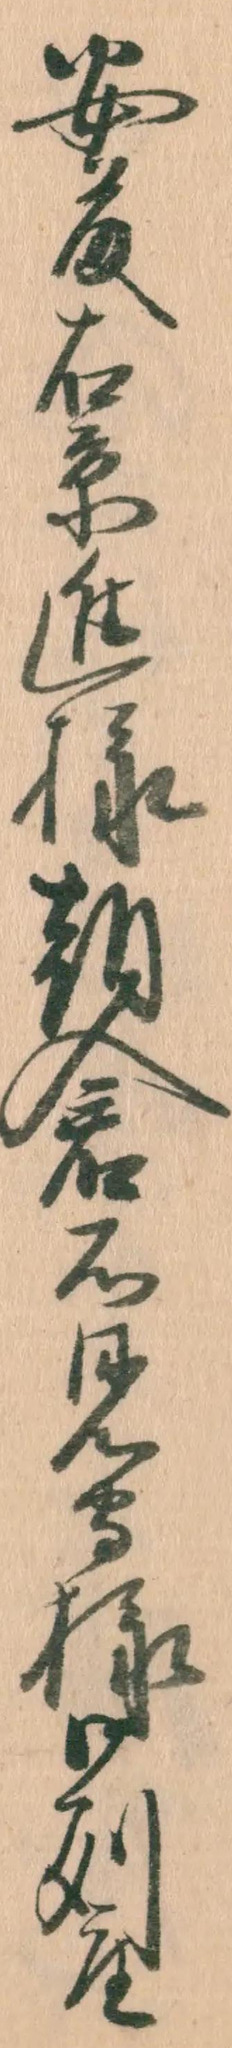安藤右京進様朝倉石見守様御列座
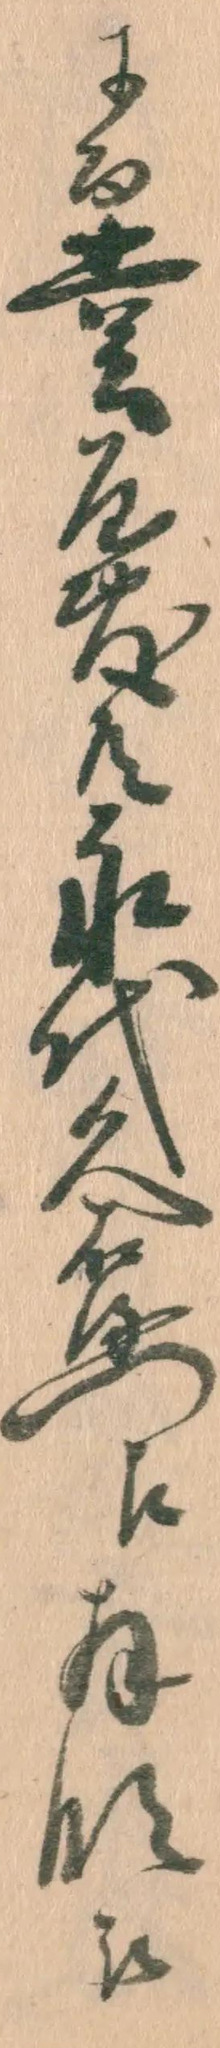に而堂屋敷共永代久右衛門え拝領被
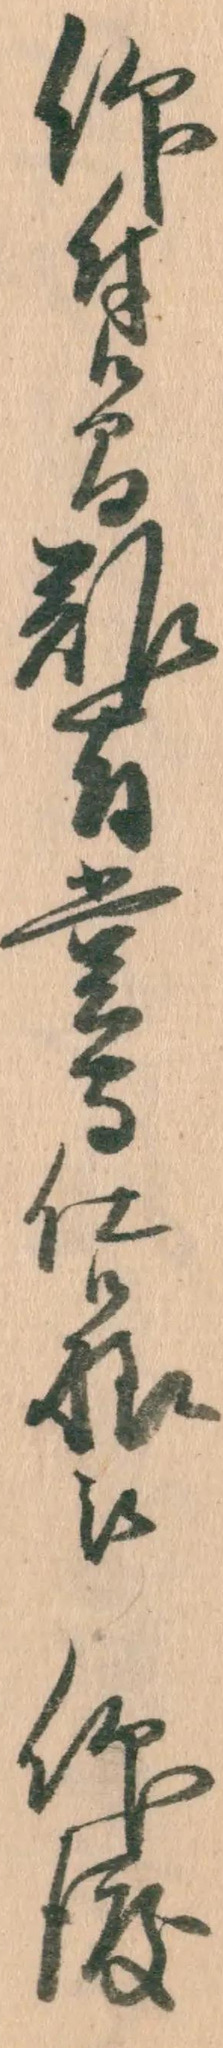仰付候間難有堂守仕候様被仰渡
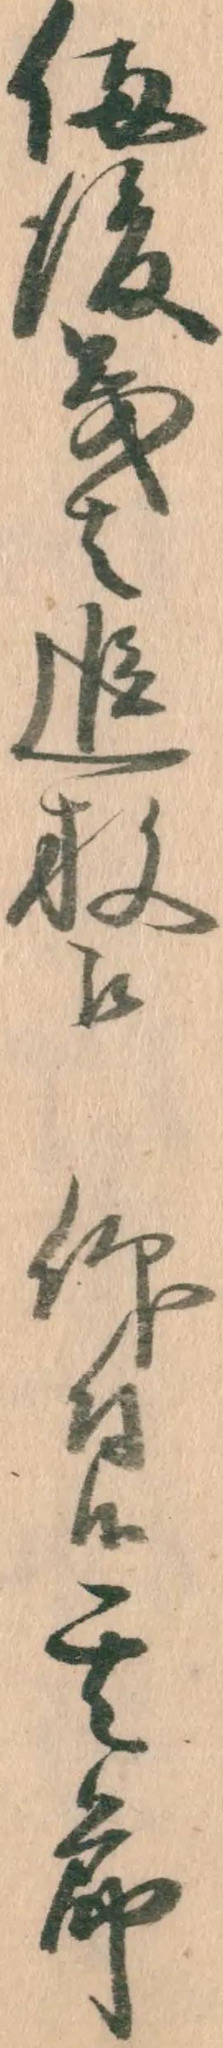備後義は追放被仰付候其節
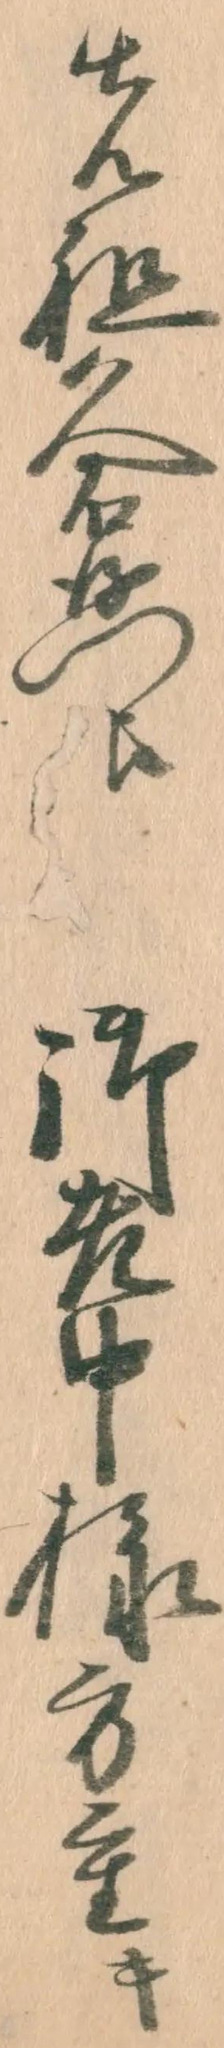先祖久右衛門え御老中様方重き

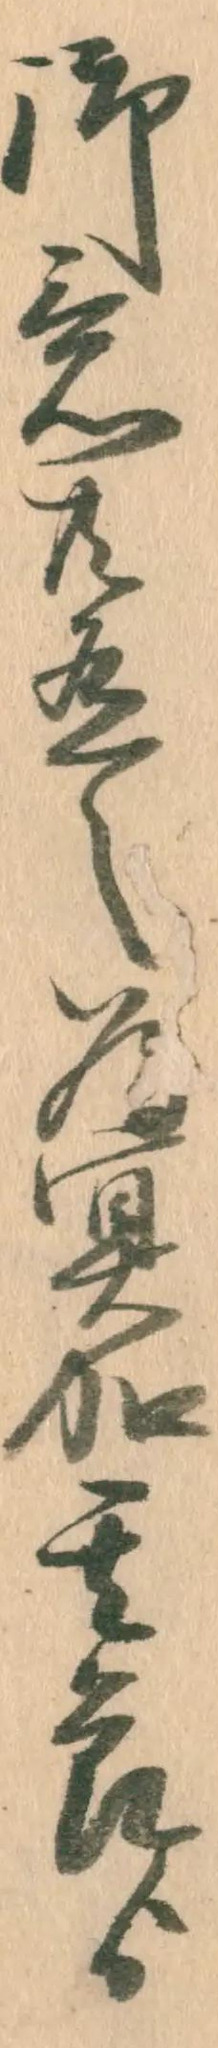御意共有之為冥加其節ゟ
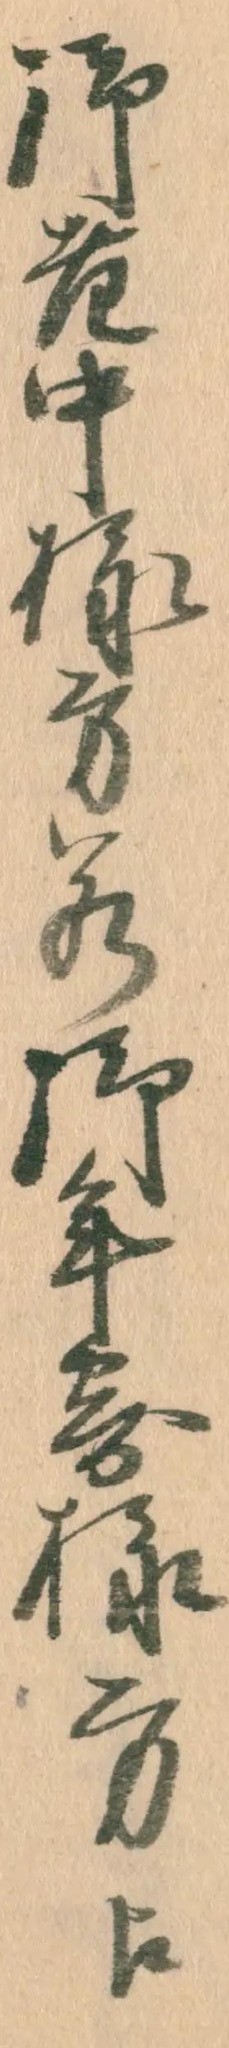御老中様方若御年寄様方え
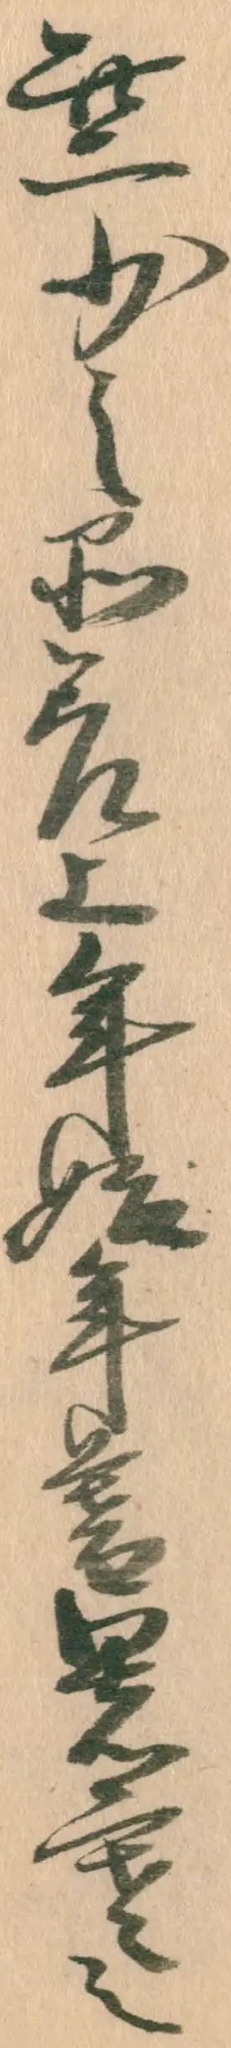些少之品差上年始年暮暑寒之
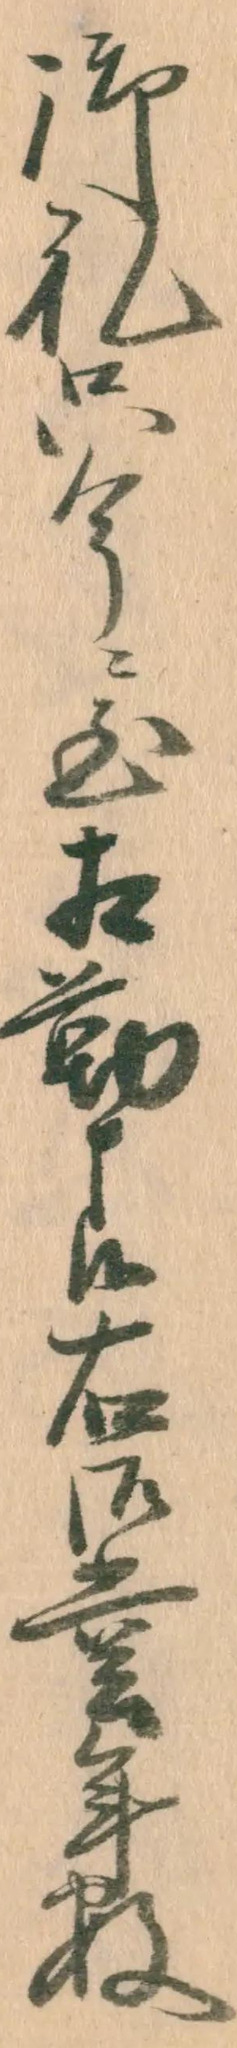御礼只今に至相勤申候右堂年数
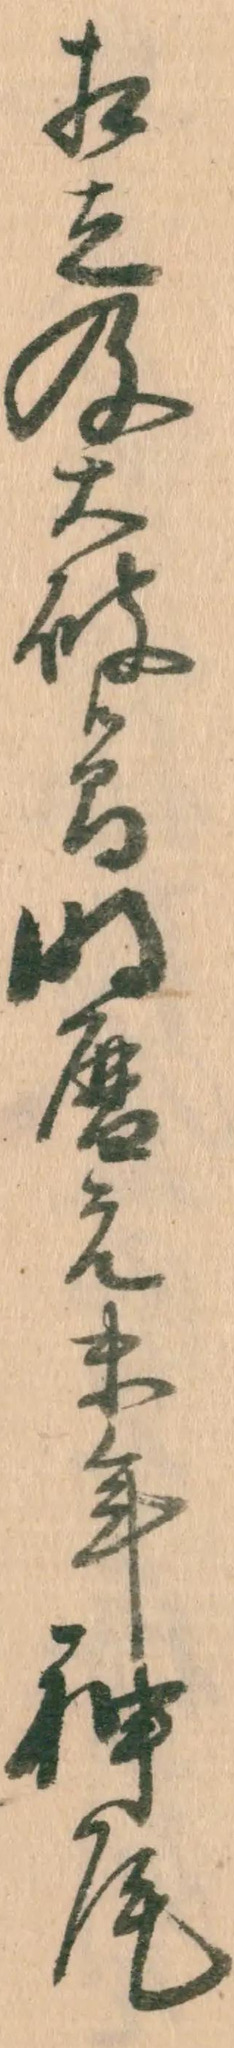相立及大破候間明暦元未年神尾
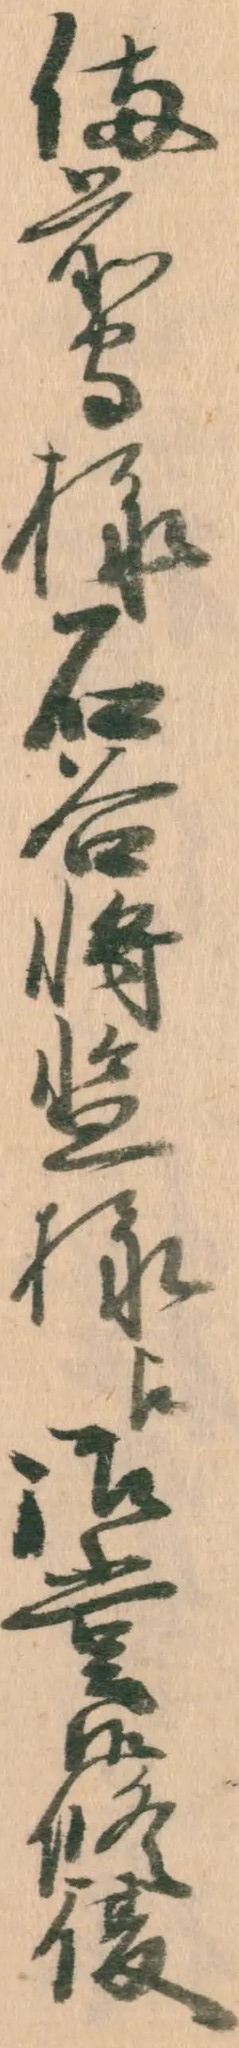備前守様石谷将監様え御堂御修復
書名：三十三間堂. [1]
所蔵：国立国会図書館 National Diet Library, JAPAN
